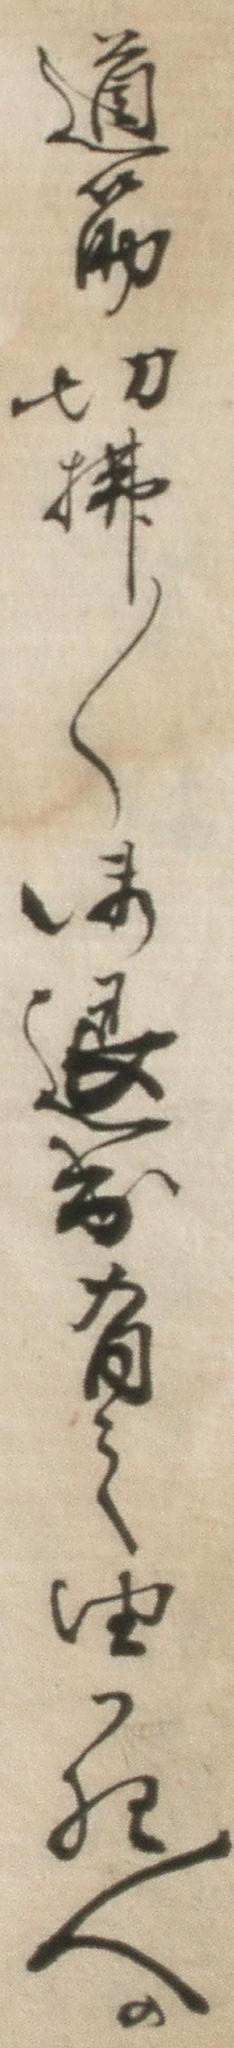道筋切払〳〵御退出有之由死人の
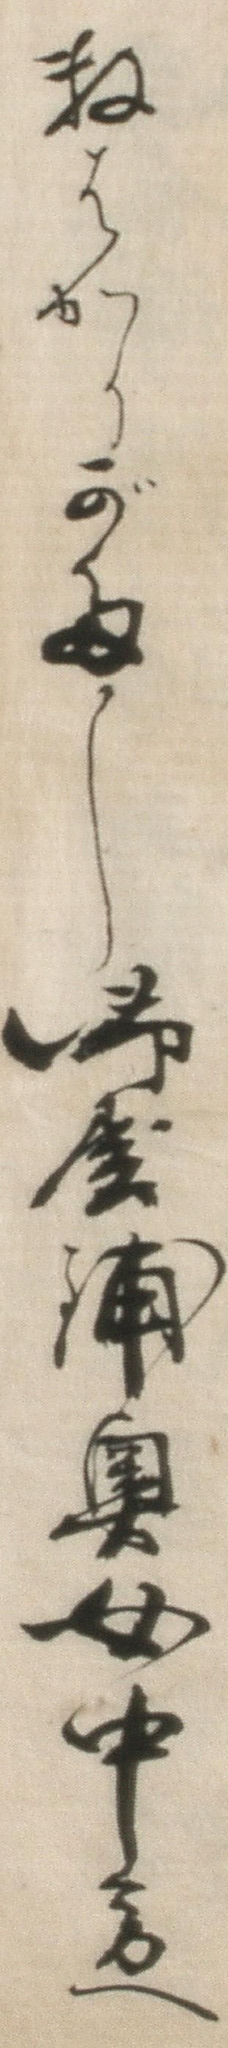数はりがたし御屋鋪奥女中方へ
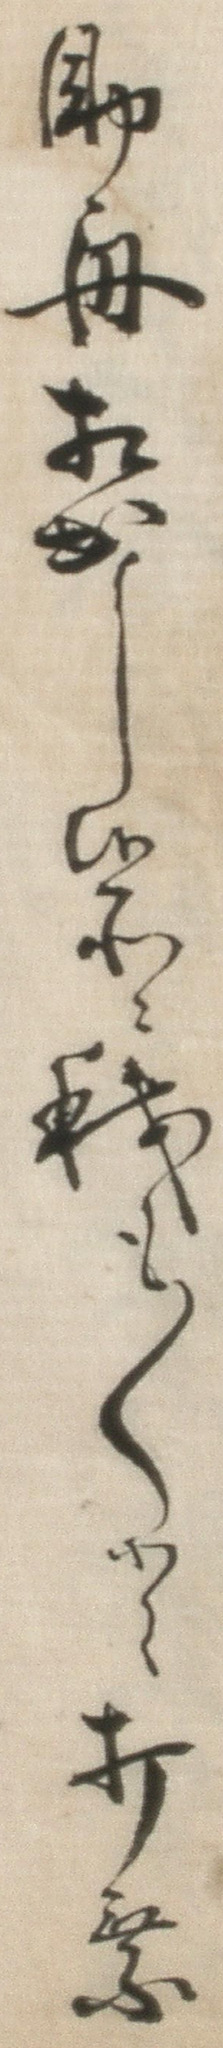助舟相出し候所二我も〳〵と打乗
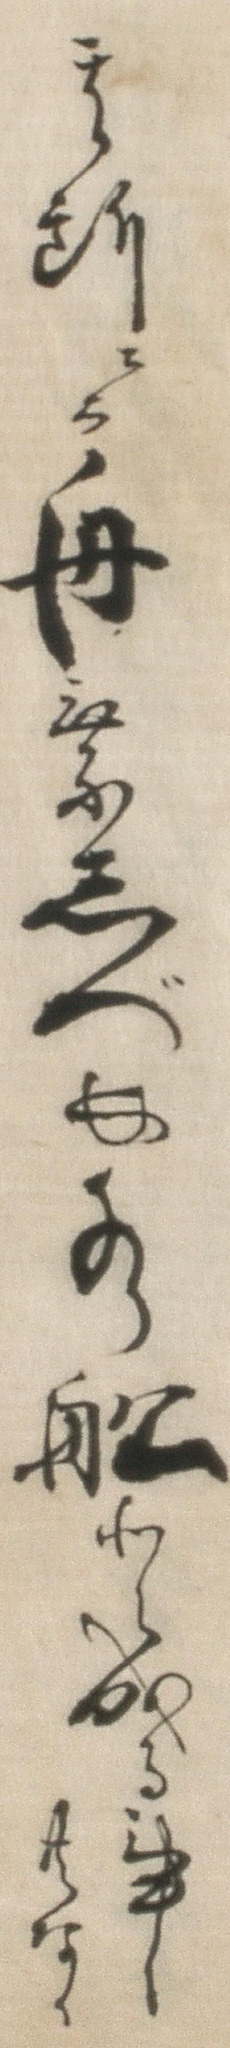其所二而舟乗しべも水船と成る事共なり
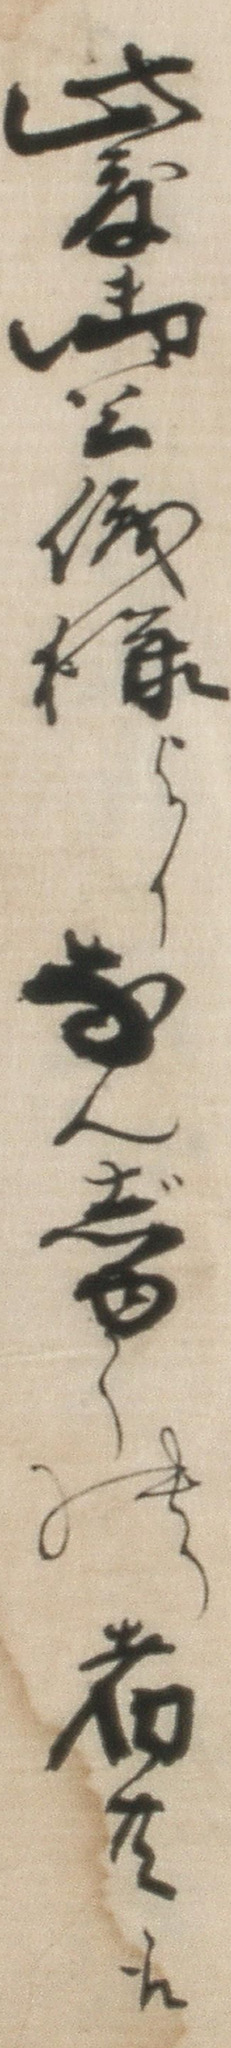此度御公儀様よりなんじゅうの者共江
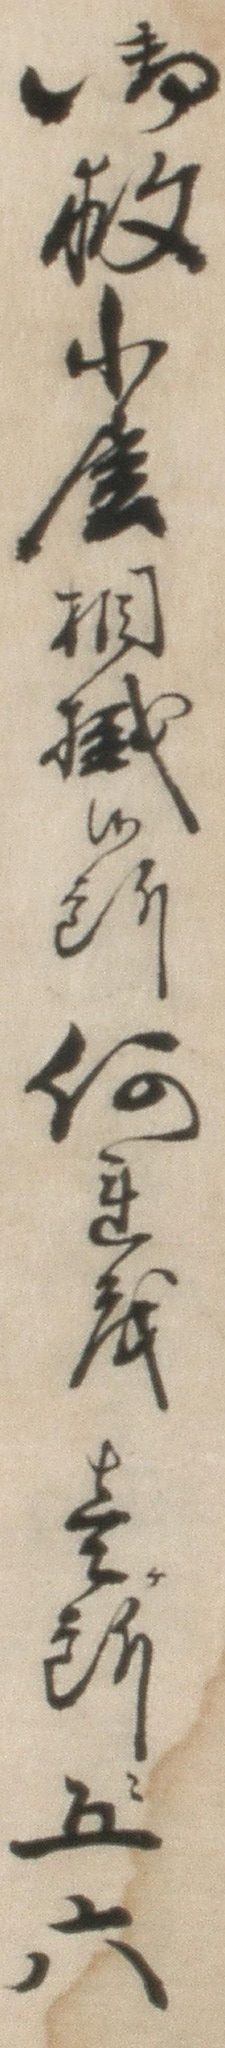御救小屋相掛候所何れも壱ヶ所二五六
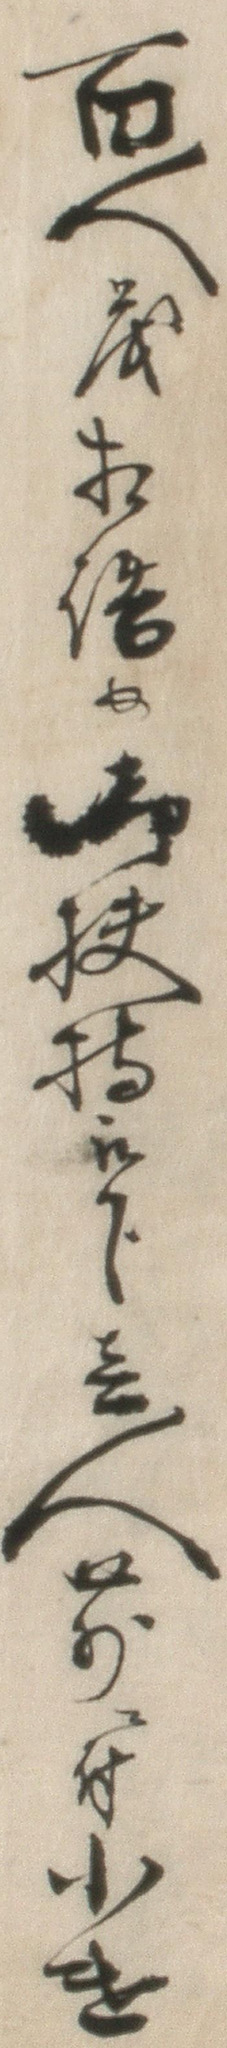百人も相詰も御扶持被下壱人前に付小遣
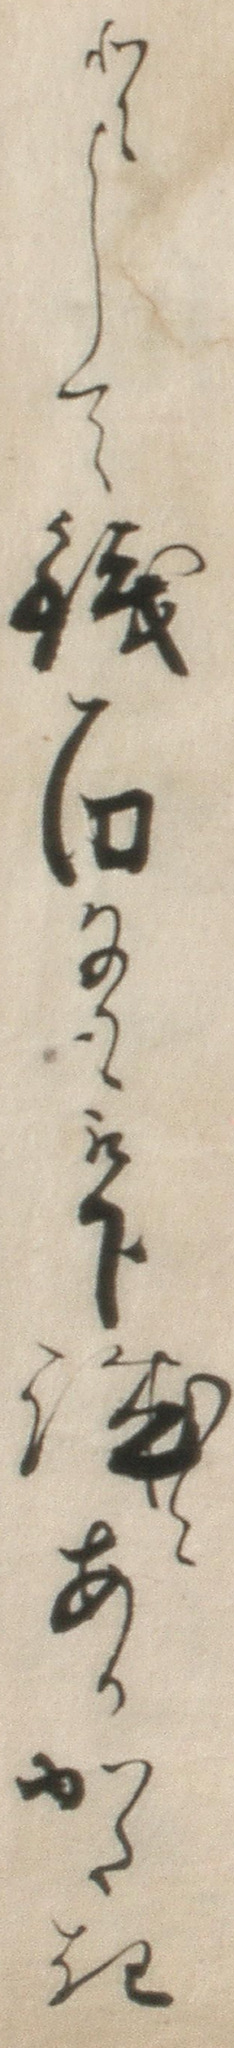として銭百文ツゝ被下誠二ありかたき
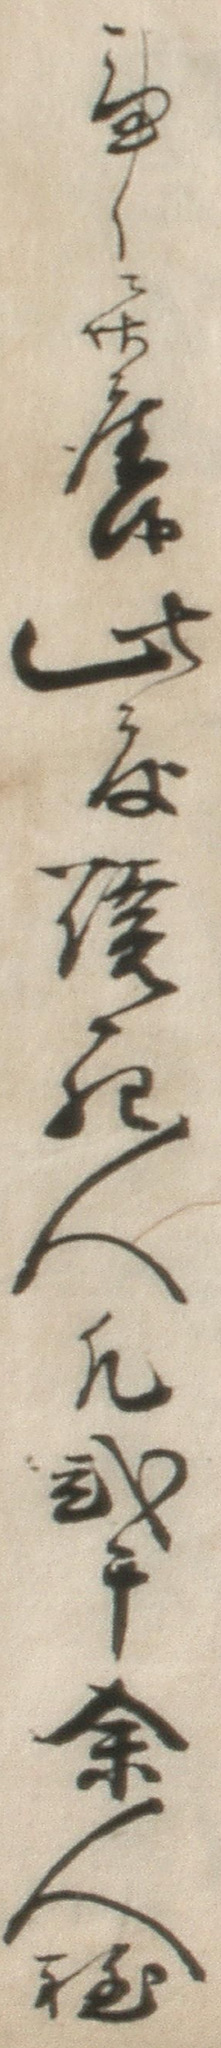事二御座候此度焼死人凡弐千余人程
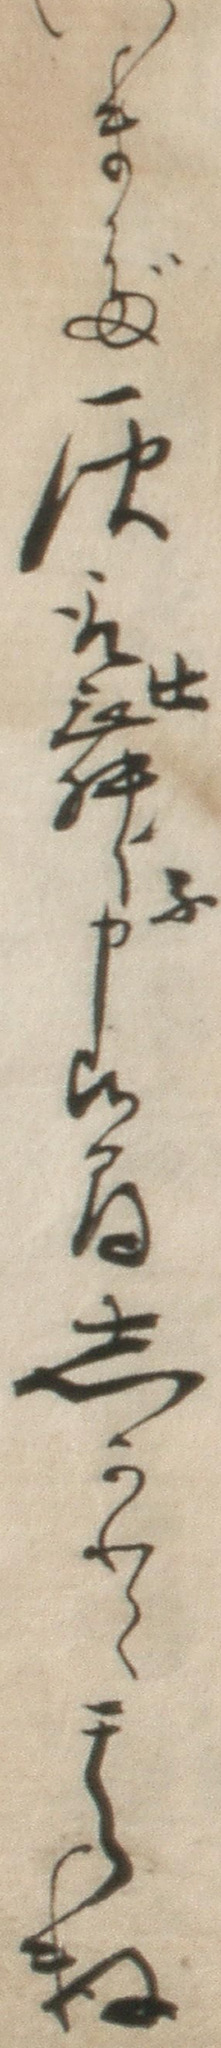いまだ灰取出舞不申候間しかと其数
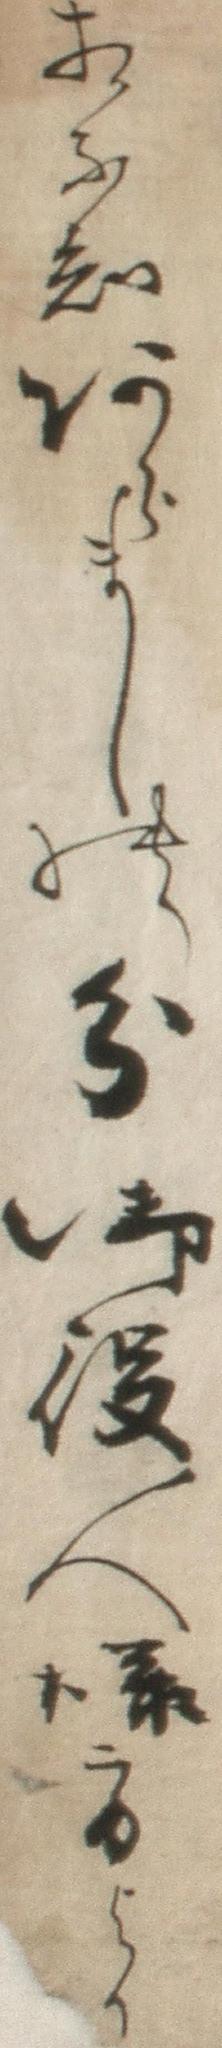相不知あらましの分御役人様方より

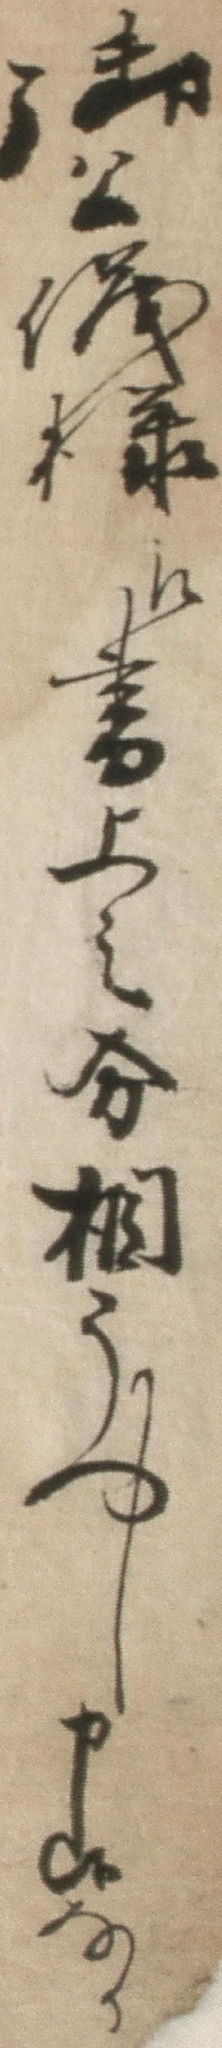御公儀様江書上之分相うつし申候なり
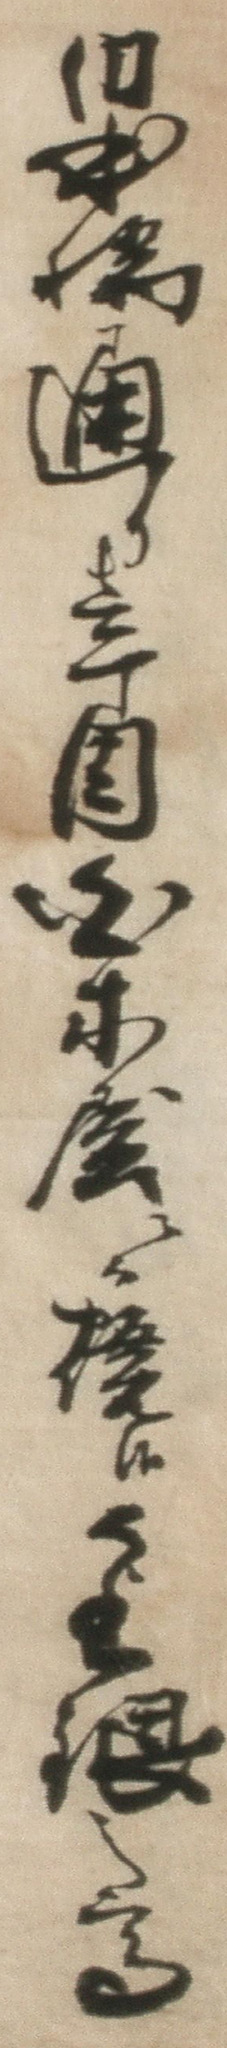日本橋通り壱丁目白木屋二而焼候金銀之高
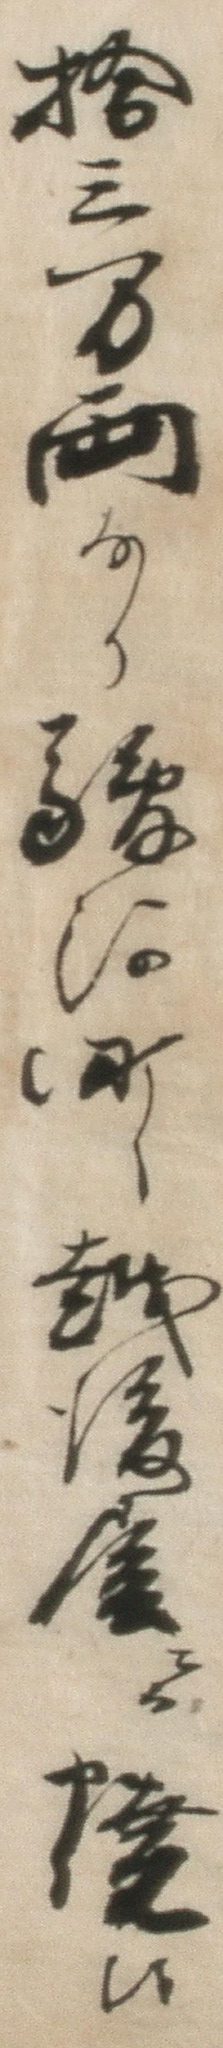拾三万両なり駿河町越後屋二而焼候
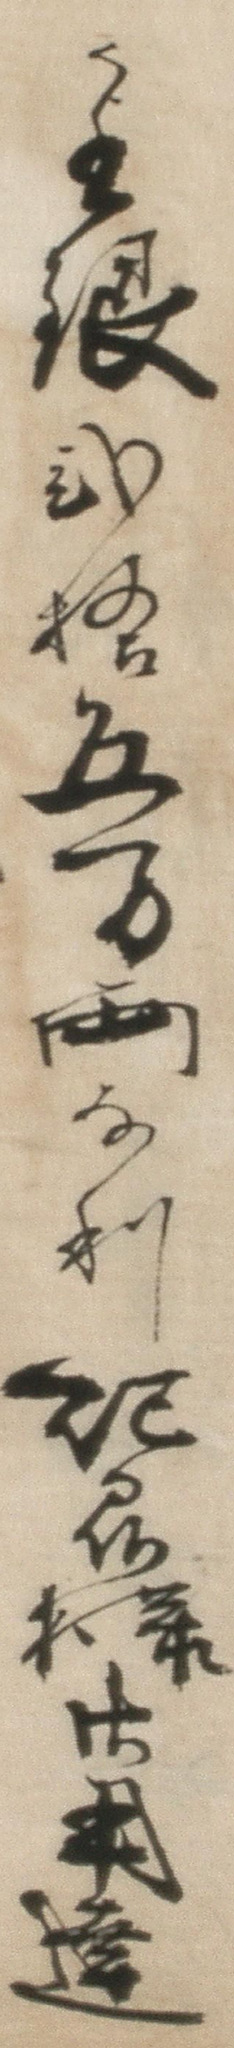金銀弐拾五万両なり紀州様御用達
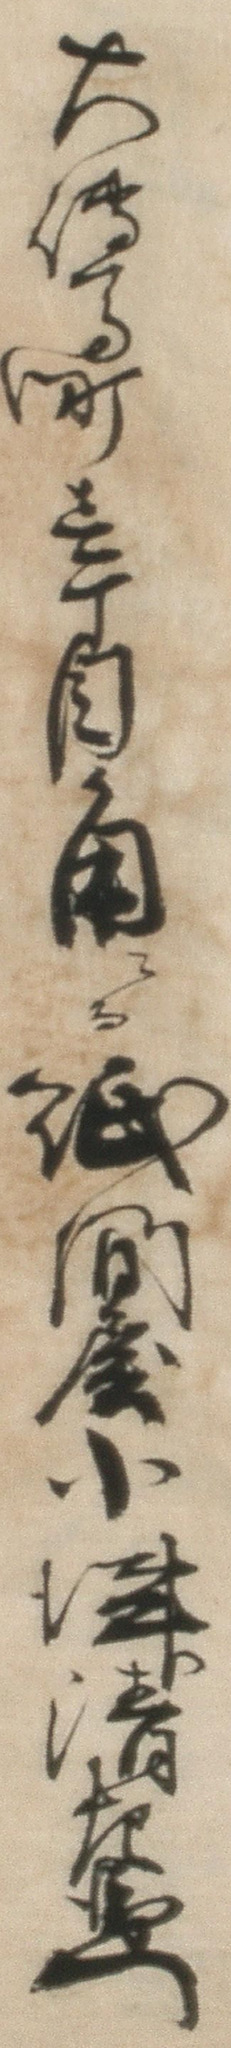大伝馬町壱丁目角二而紙問屋小津清左衛門
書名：文政十二丑としの類焼場所附
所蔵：東京大学地震研究所図書室 Earthquake Research Institute Library, The University of Tokyo, JAPAN
